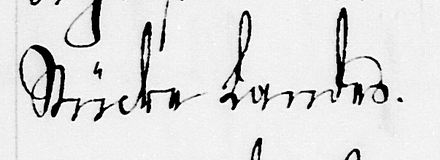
Stücke Landes.
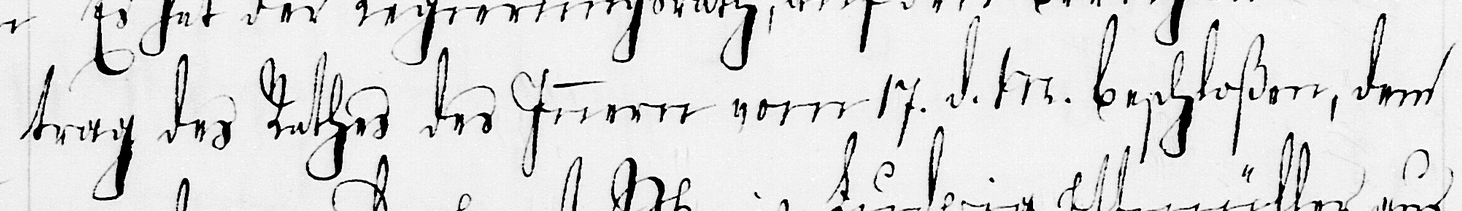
trag des Rathes des Innern vom 17. d. M. beschloßen, dem
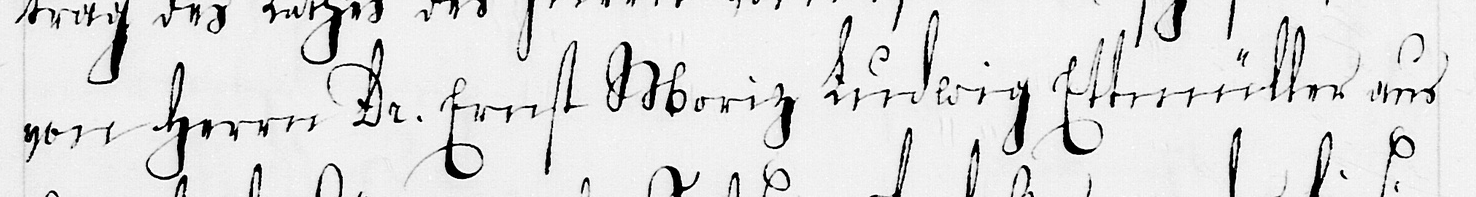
von Herrn Dr. Ernst Moriz Ludwig Ettmüller aus
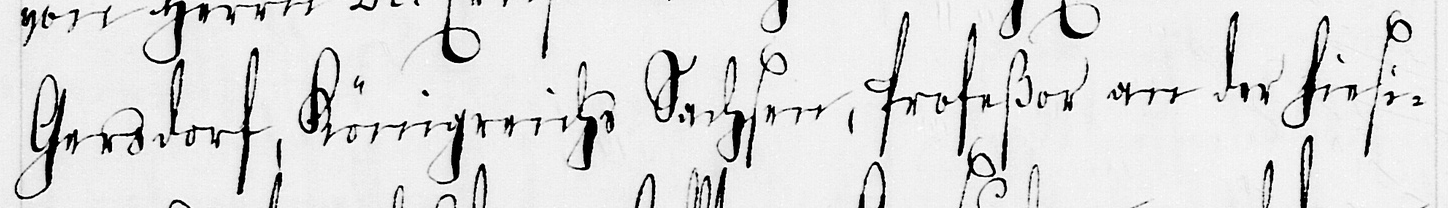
Gersdorf, Königreichs Sachsen, Profeßor an der hiesi¬
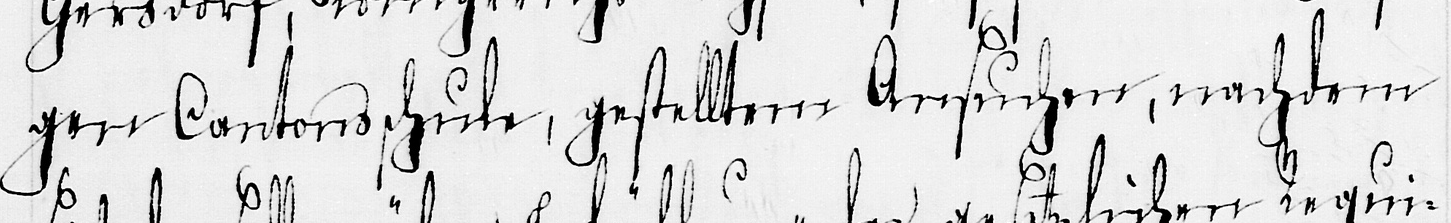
gen Cantonsschule, gestellten Ansuchen, nachdem
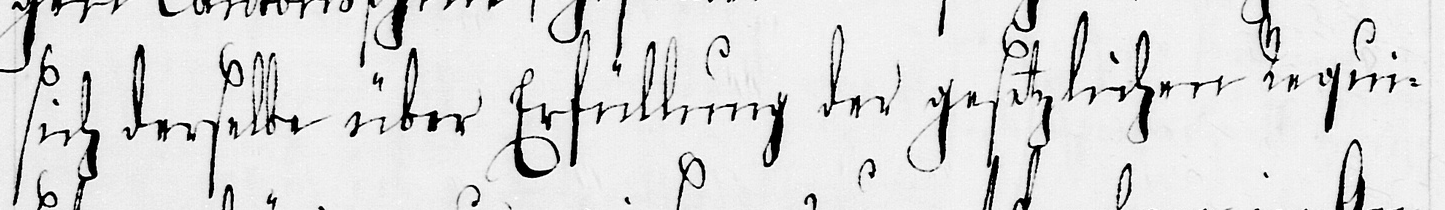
sich derselbe über Erfüllung der gesetzlichen Requi¬
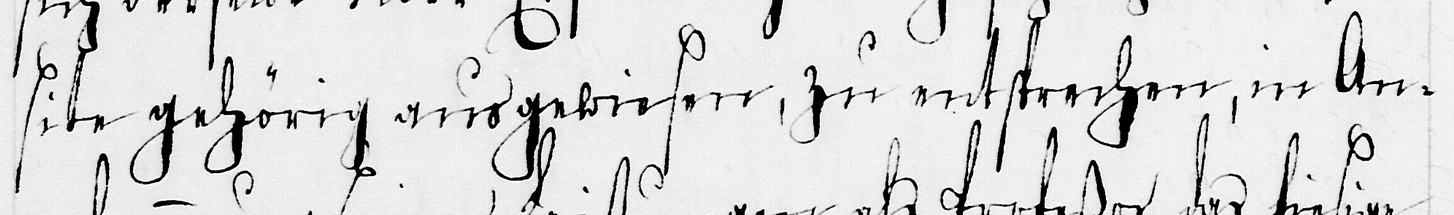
site gehörig ausgewiesen, zu entsprechen, in An¬
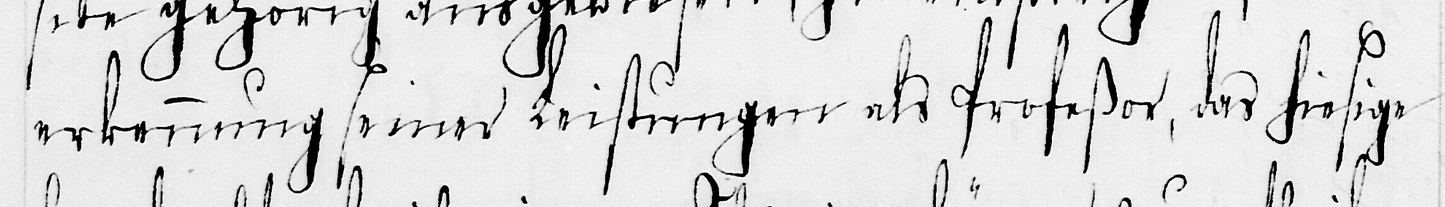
erkennung seiner Leistungen als Profeßor, das hiesige
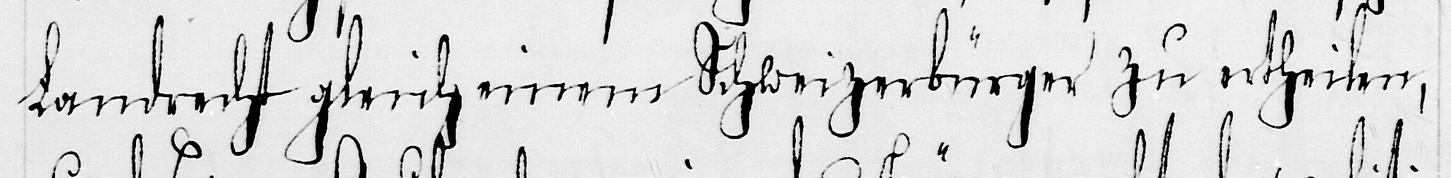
Landrecht gleich einem Schweizerbürger zu ertheilen,
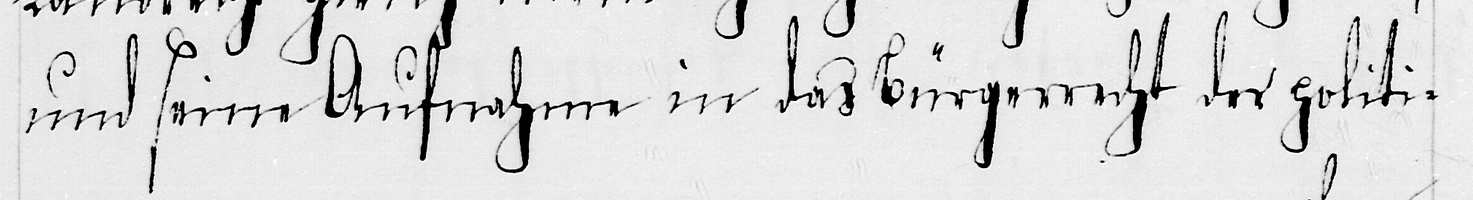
und seine Aufnahme in das Bürgerrecht der politi-
